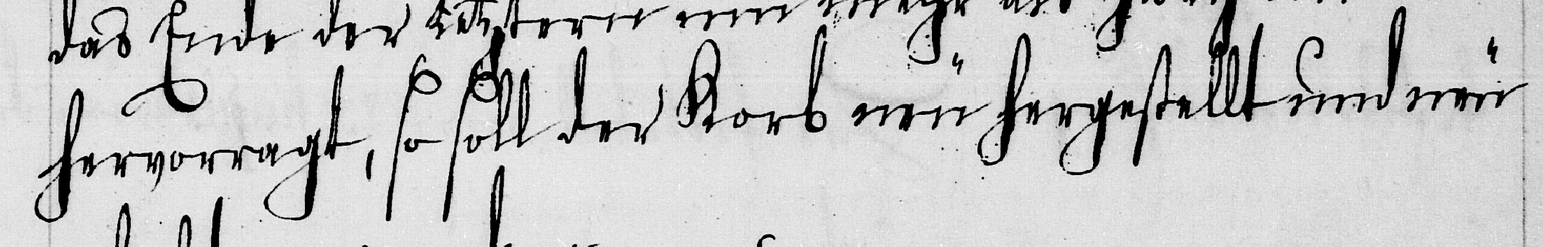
hervorragt, so soll der Korb neu hergestellt und neu
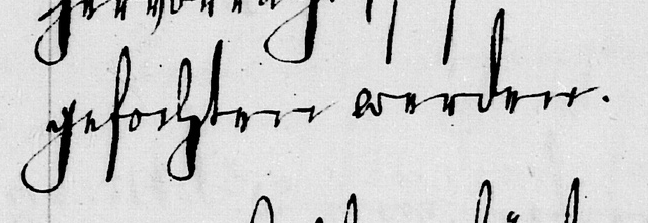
gefochten werden.
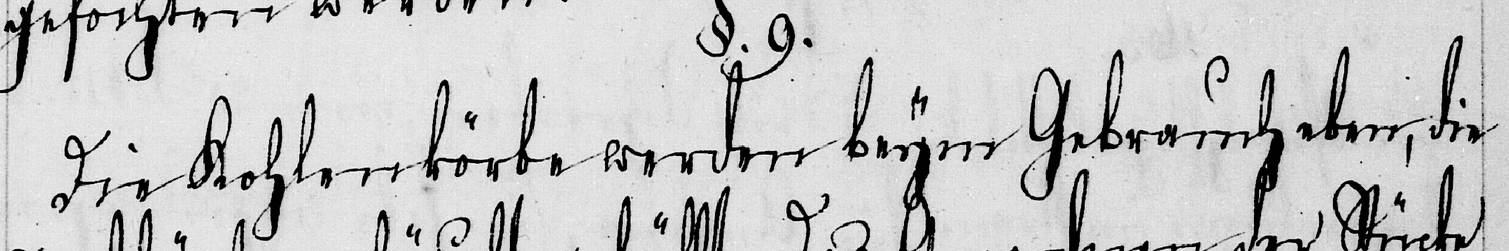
Die Kohlenkörbe werden beym Gebrauch eben,
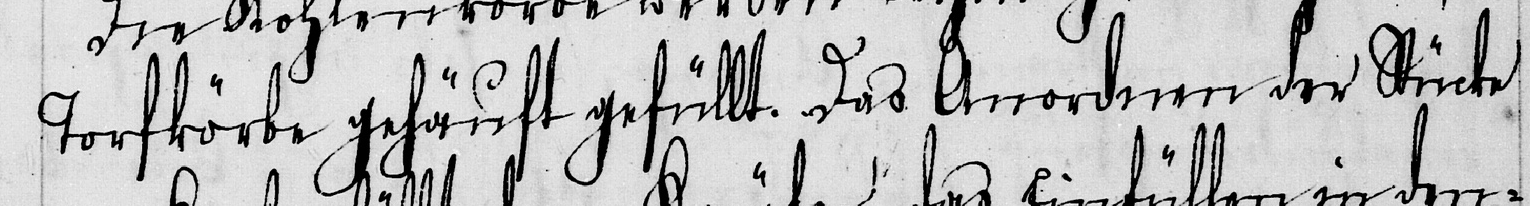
Torfkörbe gehäuft gefüllt. Das Anordnen der Stücke
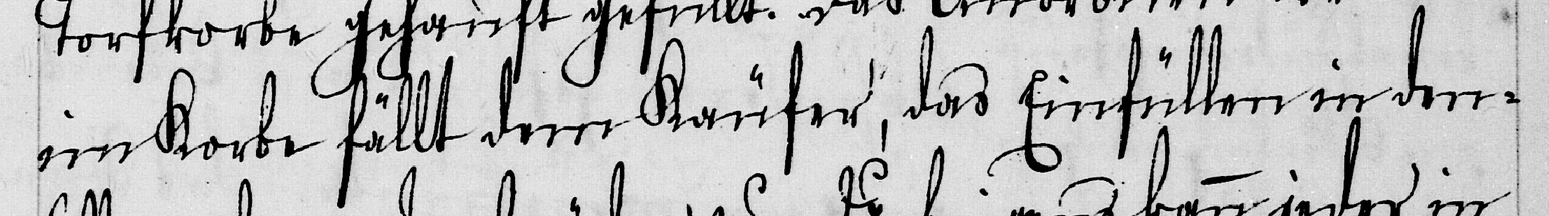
im Korbe fällt dem Käufer, das Einfüllen in den¬
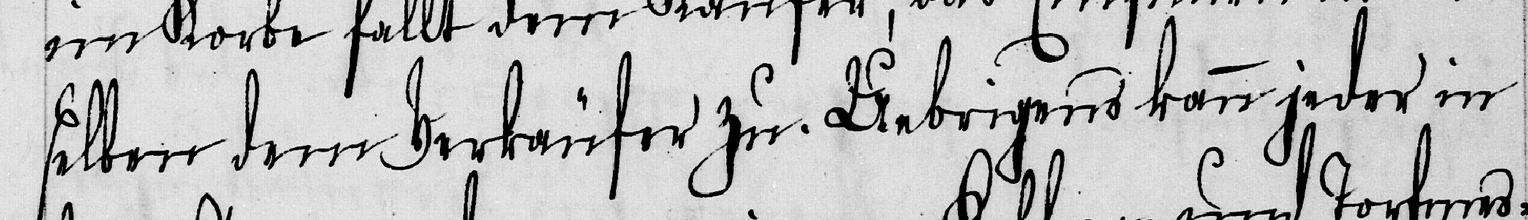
selben dem Verkäufer zu. Uebrigens kann jeder in
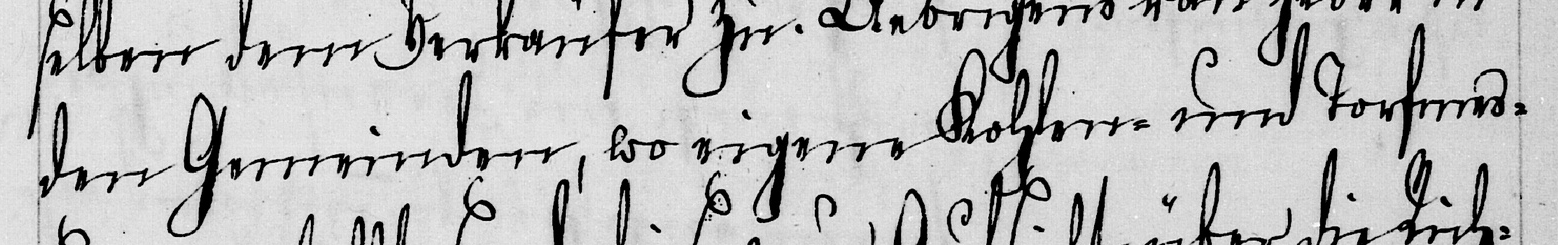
den Gemeinden, wo eigene Kohlen- und Torfmes¬
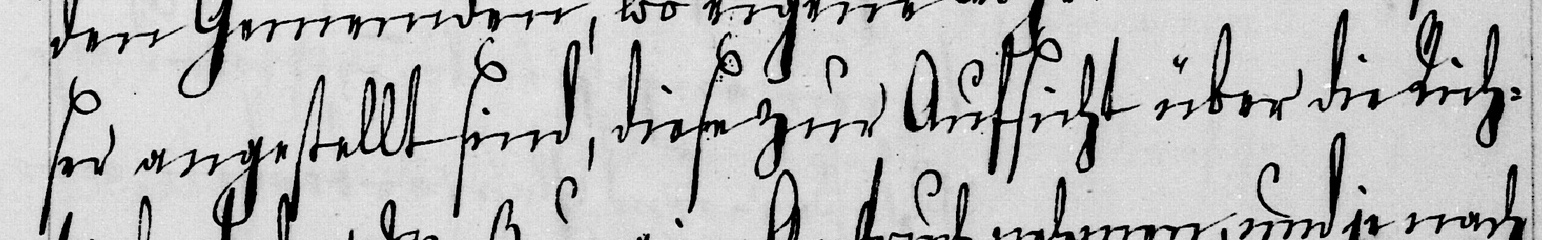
ser angestellt sind, diese zur Aufsicht über die Rich¬
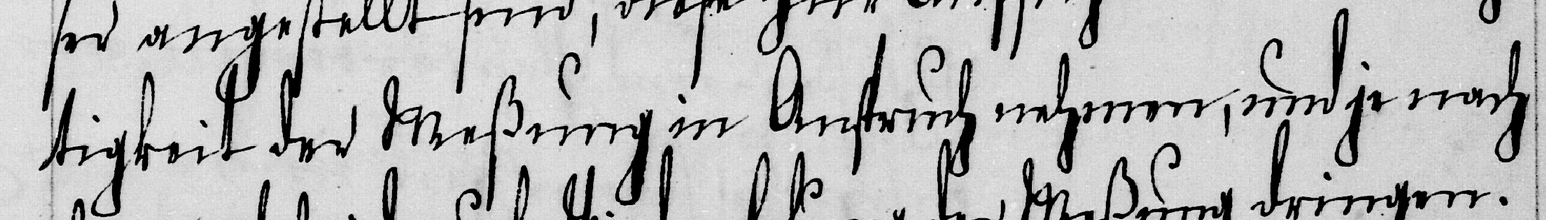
tigkeit der Meßung in Anspruch nehmen, und je nach
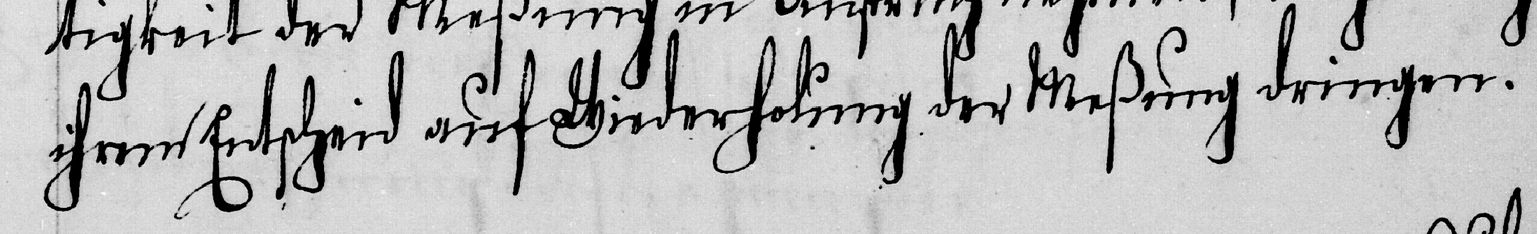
ihrem Entscheid auf Wiederholung der Meßung dringen.
